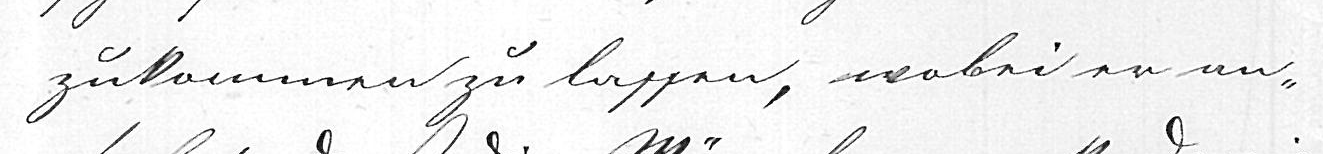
zukommen zu lassen, wobei er an-
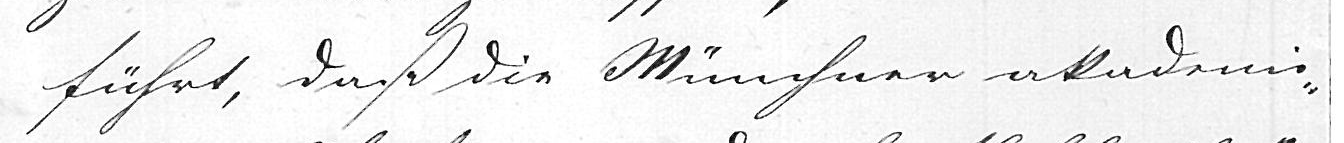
führt, daß die Münchner akademi-
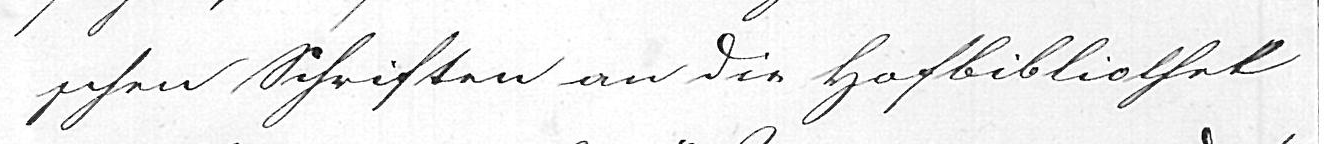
schen Schriften an die Hofbibliothek
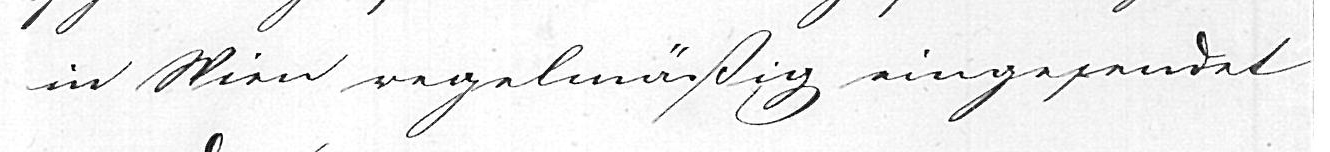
in Wien regelmäßig eingesendet
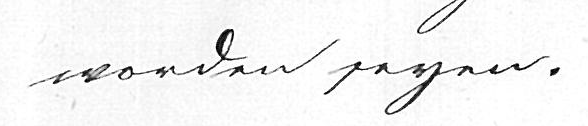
worden seyen.
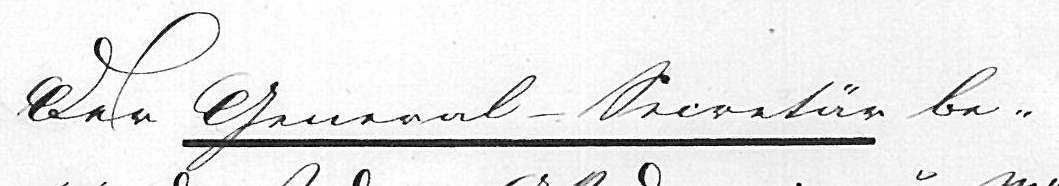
Der General- Secretär be-
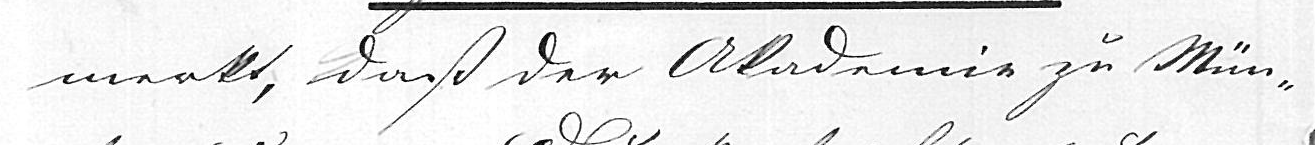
merkt, daß der Akademie zu Mün-
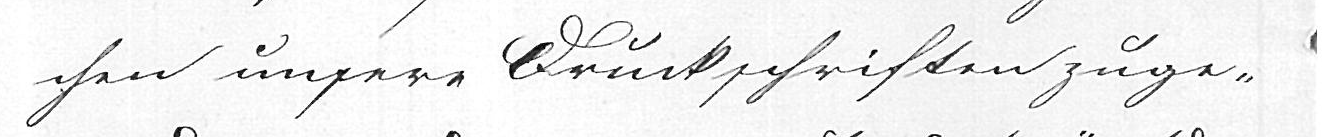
chen unsere Druckschriften zuge-
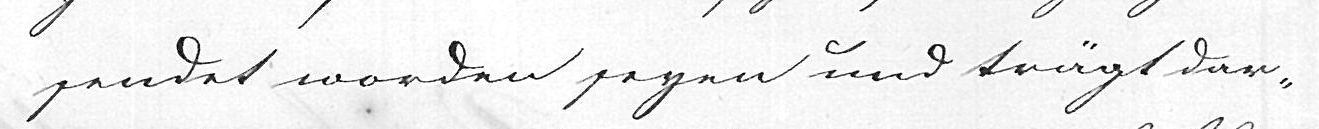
sendet worden seyen und trägt dar-
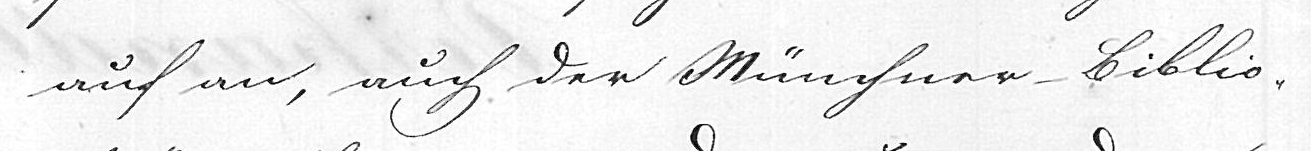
auf an, auch der Münchner Biblio-
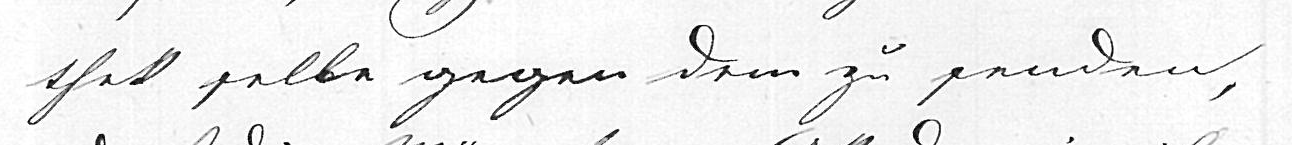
thek selbe gegen dem zu senden,
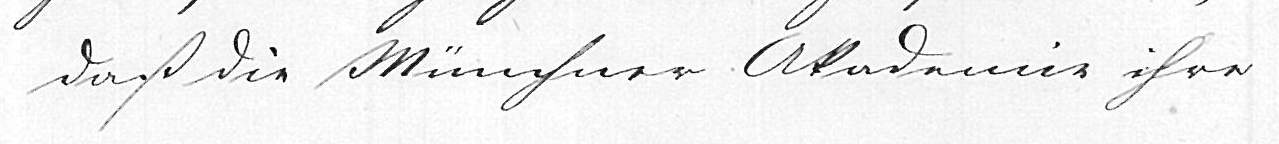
daß die Münchner Akademie ihre
